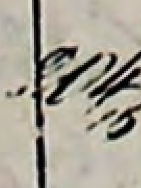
204/6
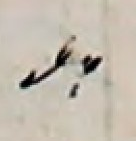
Do
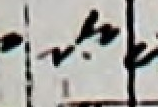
Do
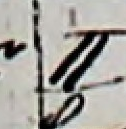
II
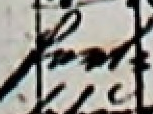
fort„
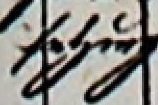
setzung
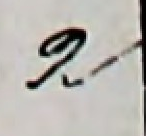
2
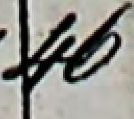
46
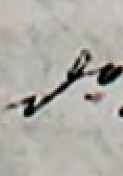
Do
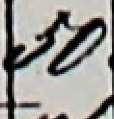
50
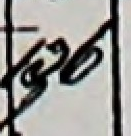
136
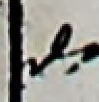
Do
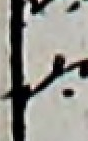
Do
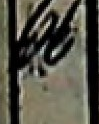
66
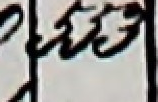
553
